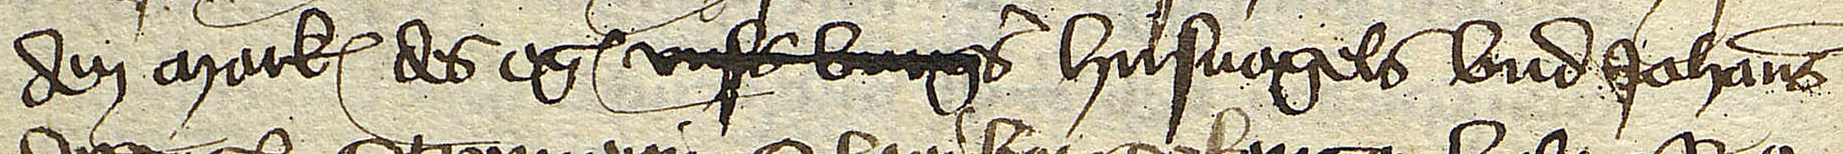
den Mark* des eg* vnſ*s burgs* hirſnagels vnd Iohans*
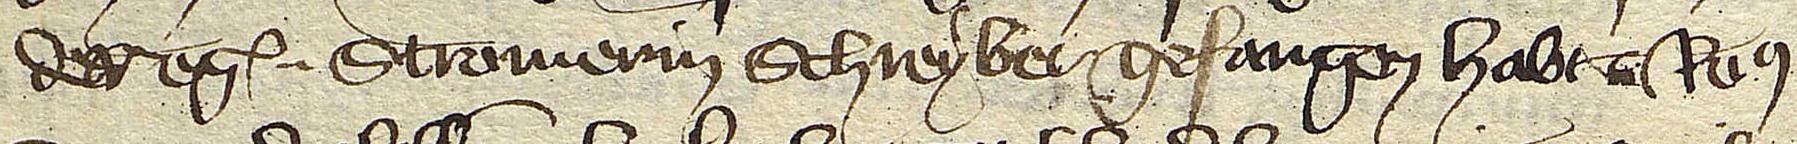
der eg* ~ Stromerin Schreyber gefangen habt / Ro*
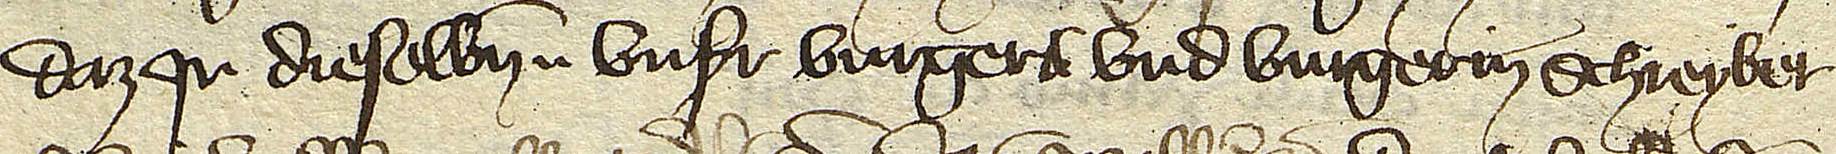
daʒ Ir dieſelbn* ~ vnſ*r burgers vnd burgerin Schreyber
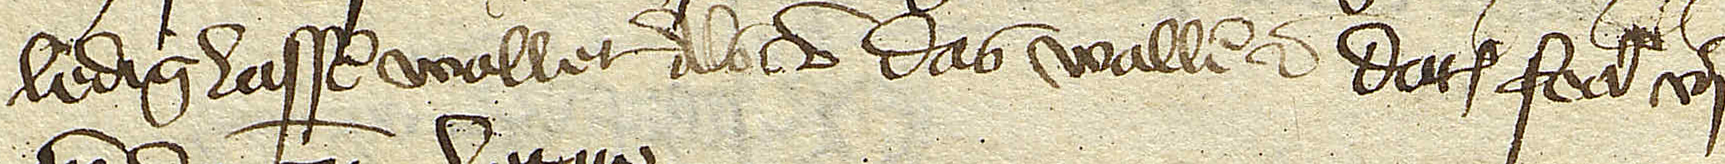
ledig laſſe* wöllet Als ec* das wolle* ec* dat* fea* vi*
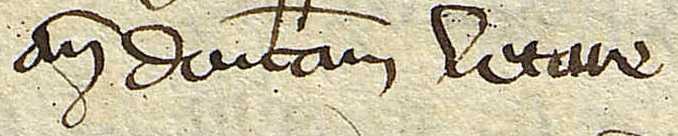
en* doicam* letare
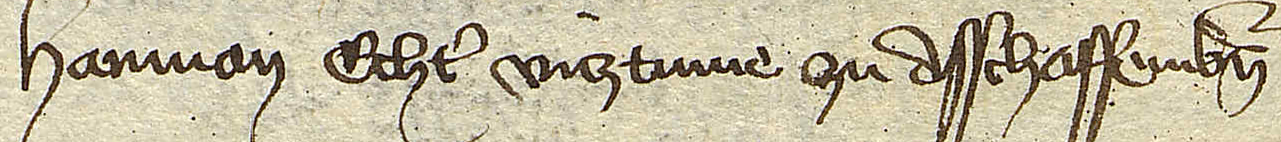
Hanman Echt* vicʒtume cʒu Aſſchaffemb*g
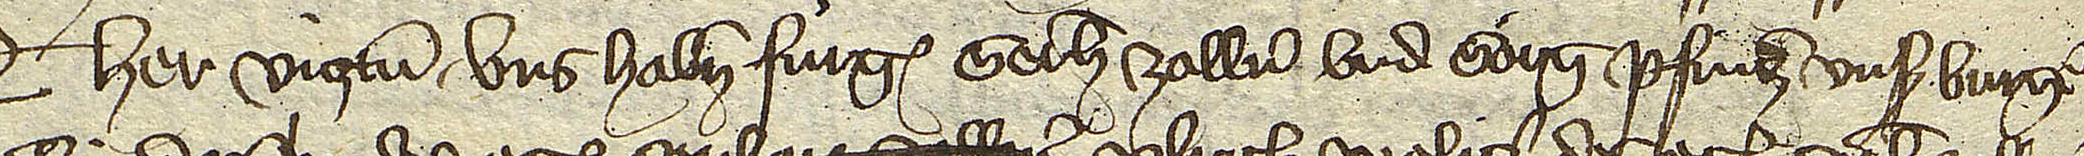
L* her vicʒtu* / vns habn* fürg* Gerh* cʒolln* vnd Görg* pfincʒ* vnſ* burge*
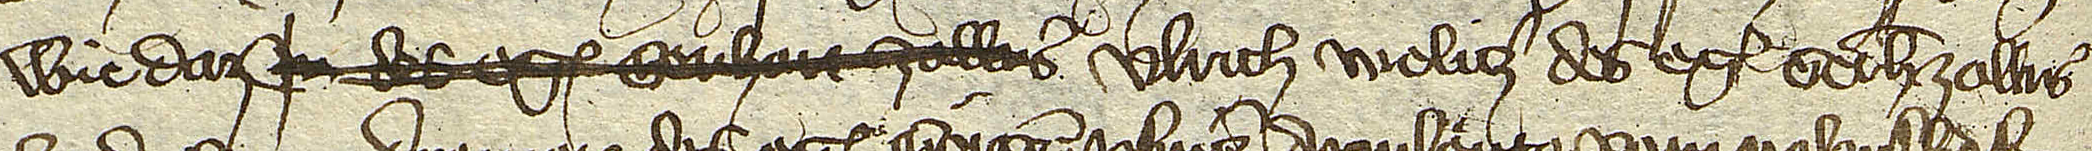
wie daʒ In des eg* Erhart cʒollens* vlrich welicʒ des eg* Gerh* cʒollns*
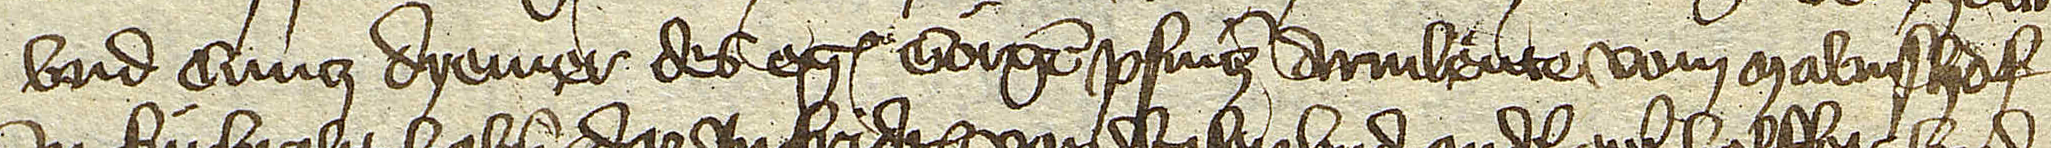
vnd Cuncʒ dyemer des eg* Görge* pfincʒ* Armleute von Malmſhof
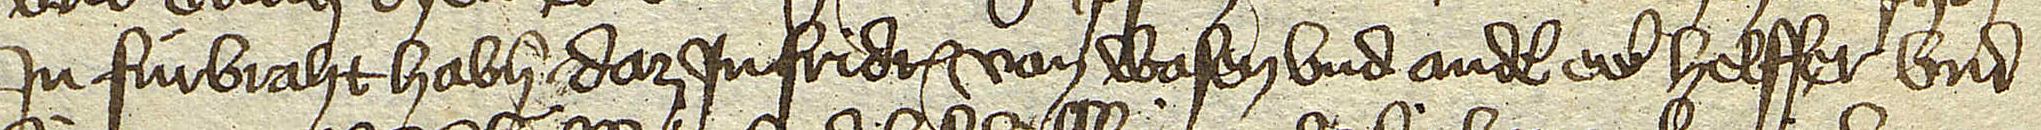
In fürbraht habn* / daʒ Im fridr* von waſen vnd ande* ew* helffer vnd
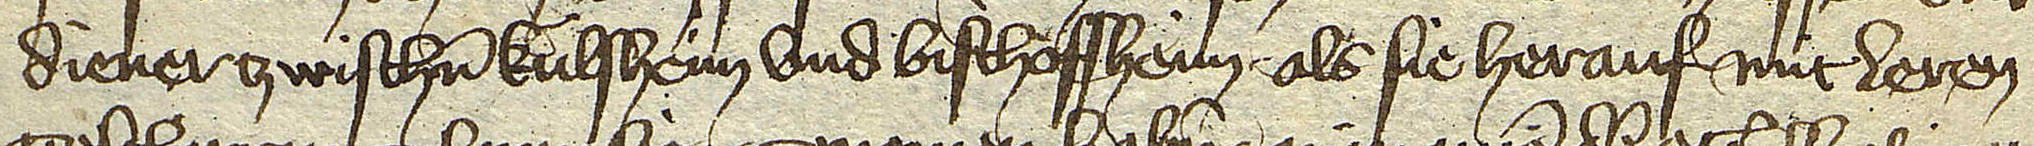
diener cʒwiſchn* külſheim vnd biſchofſheim als ſie herauf mit leren
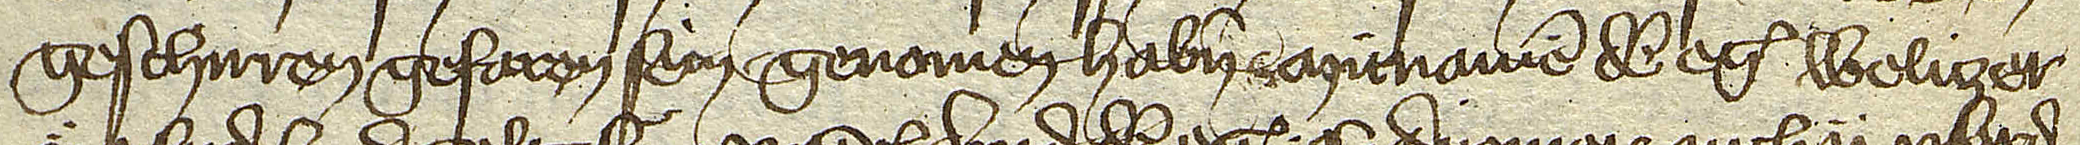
geſchirren gefacʒen ſein / genomen habn* Mitname* de* eg* welicʒer
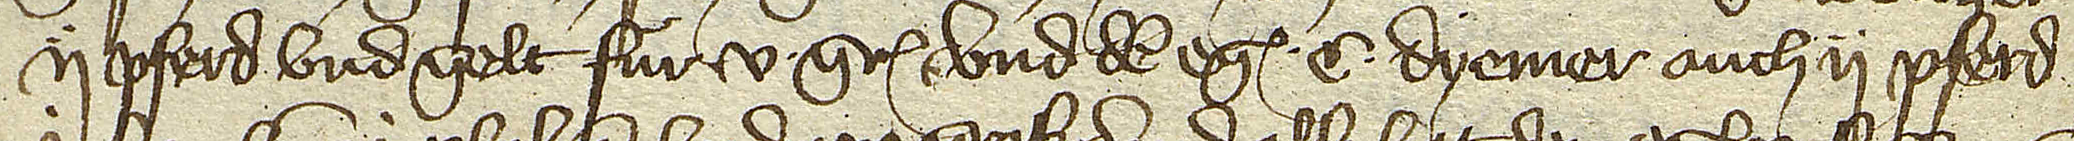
ii pferds vnd gelt für v gr* / vnd de* eg* . C . dyener auch ii pferd
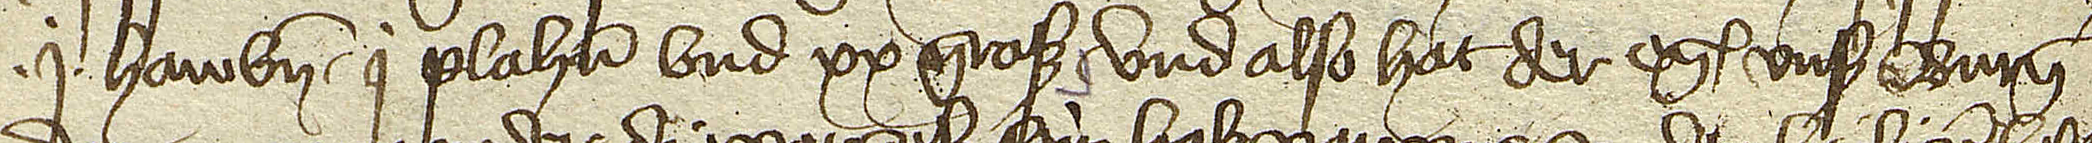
. i . hawbn* / i plahn* vnd xx groſʒ / vnd alſo hat der eg* vnſ* Burg*
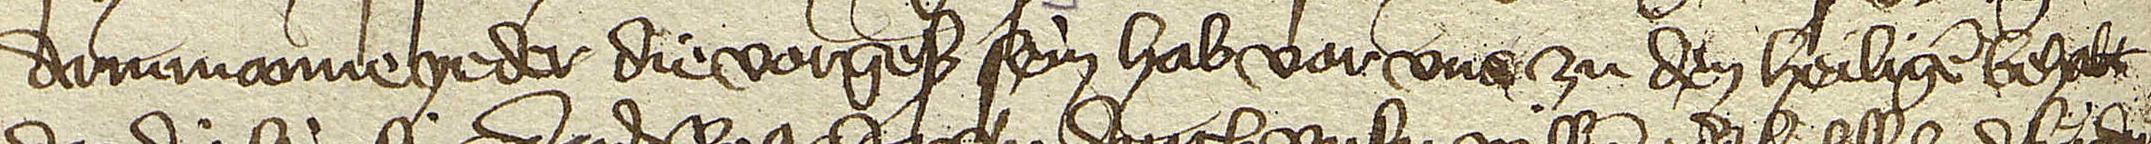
Armmanne yeder die vorgeſ* ſein gab vor vns cʒu den heilige* behabt
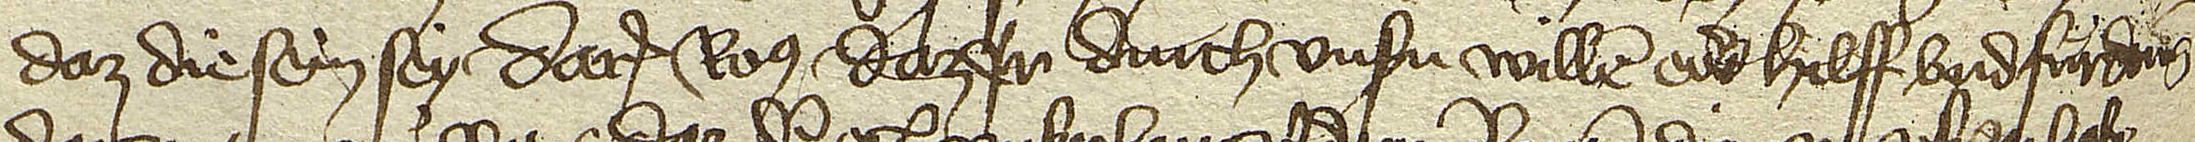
daʒ die ſein ſey / Dar* Ro* /daʒ Ir durch vnſ*n wille* ew* hilff vnd fürdug*
